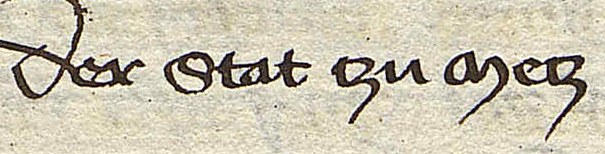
Der Stat cʒu Mecʒ
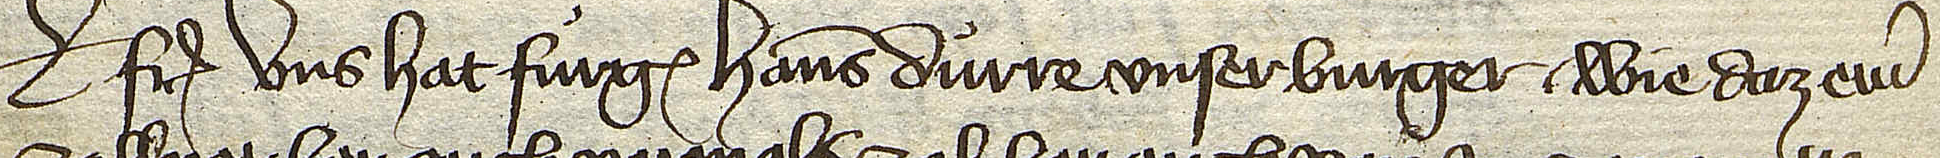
L* fr* vns hat fürg* Hans Dürre vnſer burger / wie daʒ ew*
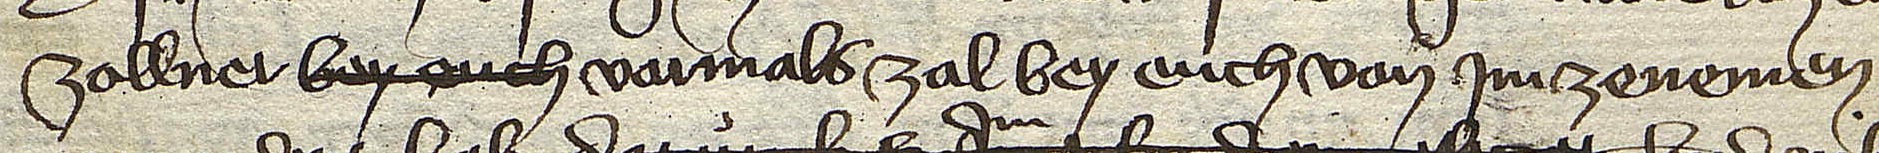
cʒollner bey euch vormals cʒol bey euch von Im cʒenemen
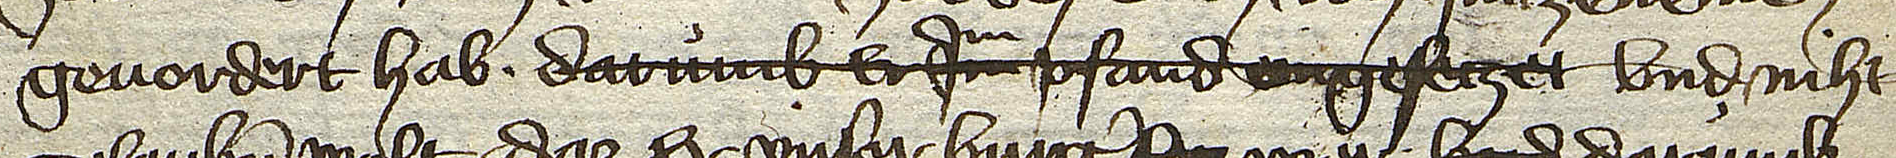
geuordert hab . darümb er Im pfand eingeſecʒet vnd niht
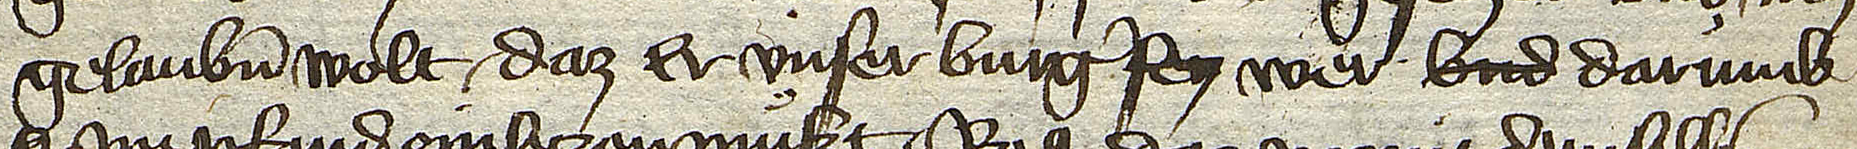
gelaub*n wolt / daʒ er vnſer burg* ſey wer vnd darümb
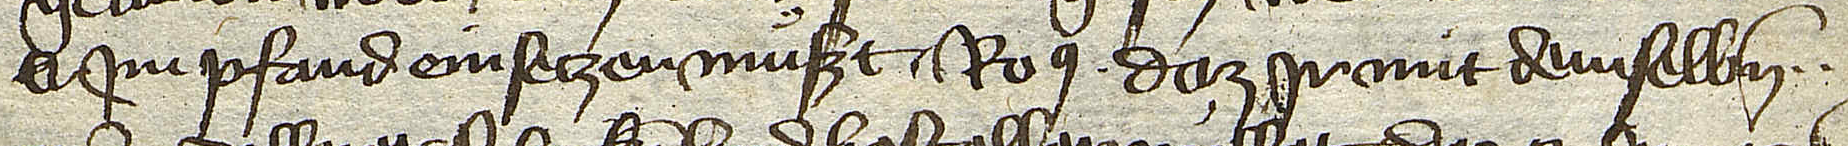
Er Im pfand einſecʒen müſʒt / Ro* . daʒ Ir mit demſelb*n ~
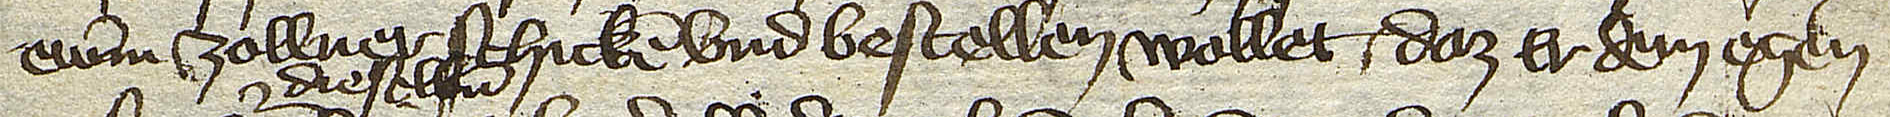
ewm* cʒollner ſchicke* vnd beſtellen wöllet / daʒ er dem egen*
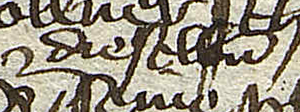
dieſelbn*
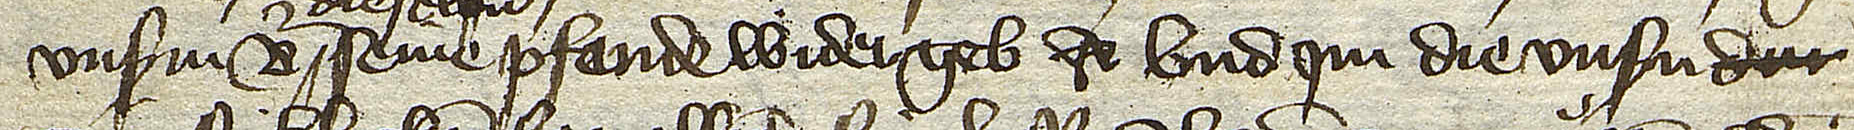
vnſ*m b* ſeine pfande widergeb vnd Im die vnſ*n dur
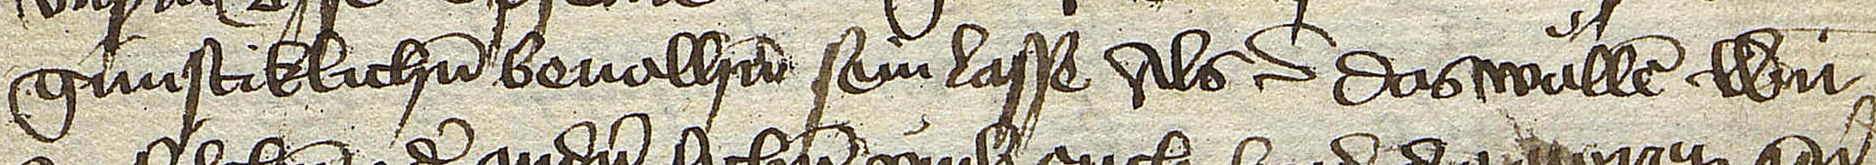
günſtiklich*n beuolhn* ſein laſſe Als ec* das wölle* wir
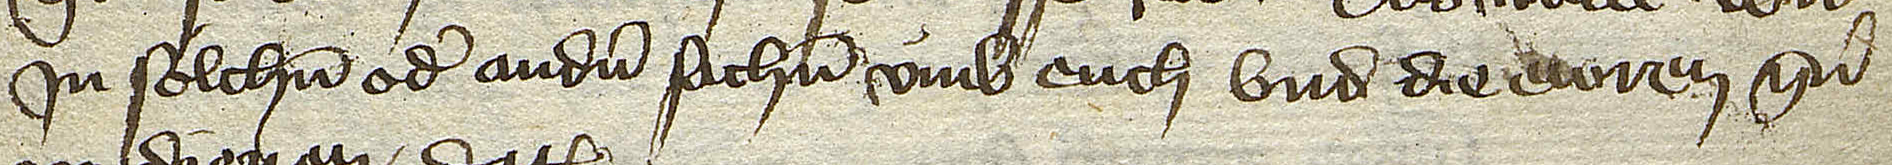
In ſölich*n od* and*n ſach*n v̈mb euch vnd die ewren gn*
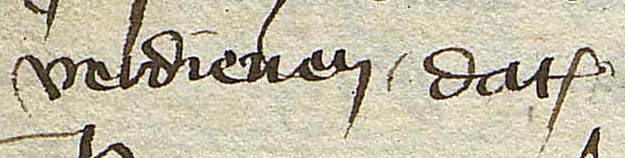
verdienen / dat*
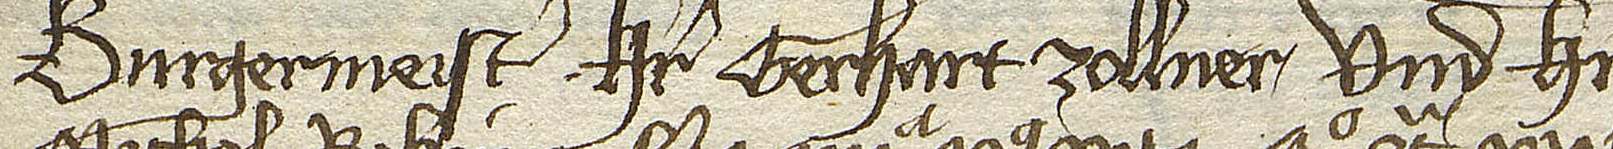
Burgermeiſt* . Hr* Gerhart ʒollner Vnd Hr*
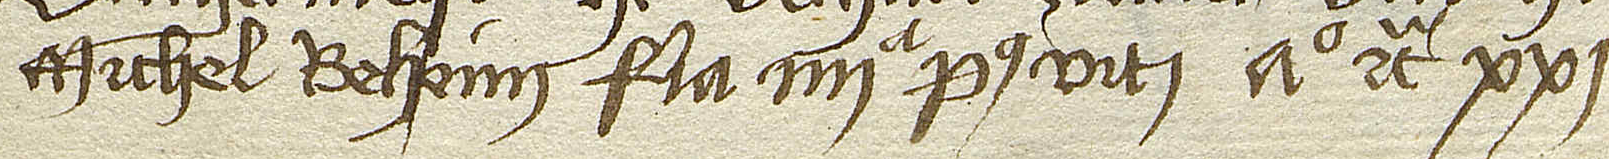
Michel Beheim fia* iiii* P* viti a* ec* xxi*
